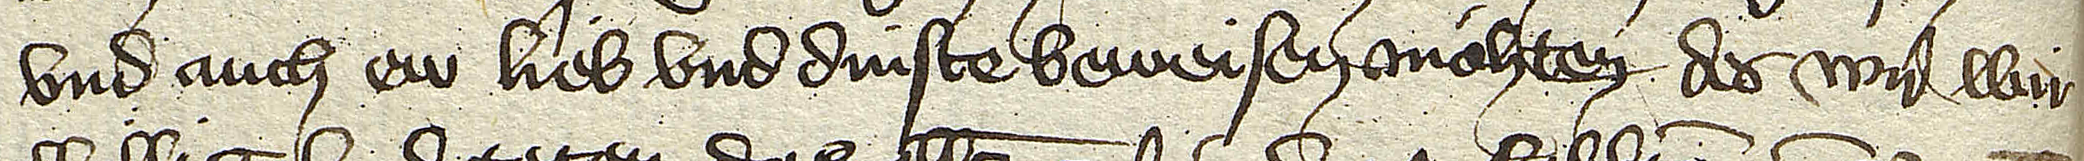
vnd auch ew lieb vnd dinſte beweiſen möhten des wn* wir
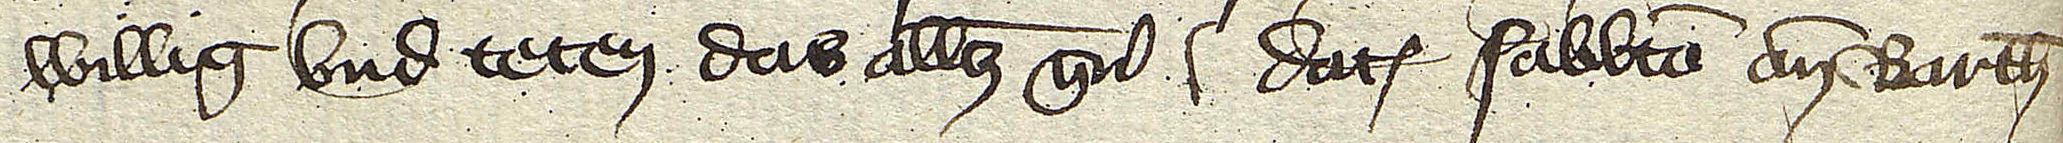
willig vnd teten das allcʒ* gn* / dat* ſabbto* an* Bartn*
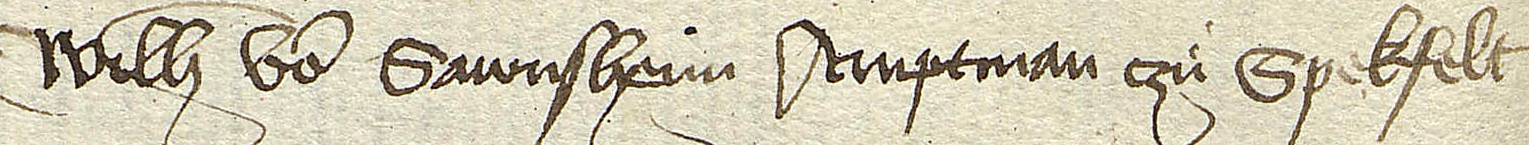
wilh* vo* Sawnſheim Amptman cʒü Spekfelt
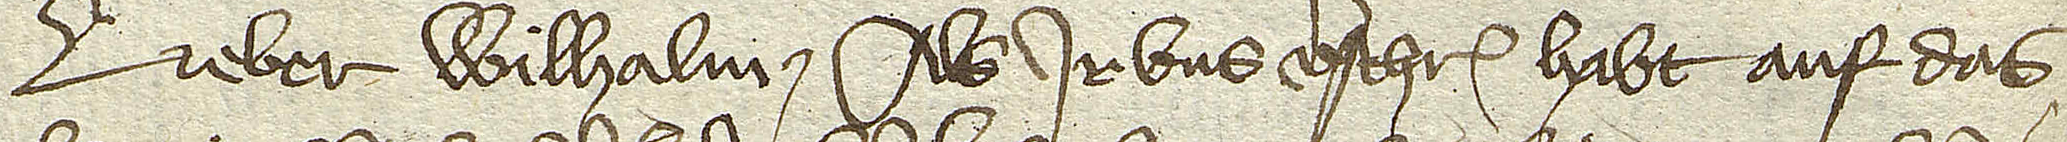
Lieber Wilhalm / Als Ir vns v*ſchr* habt auf das
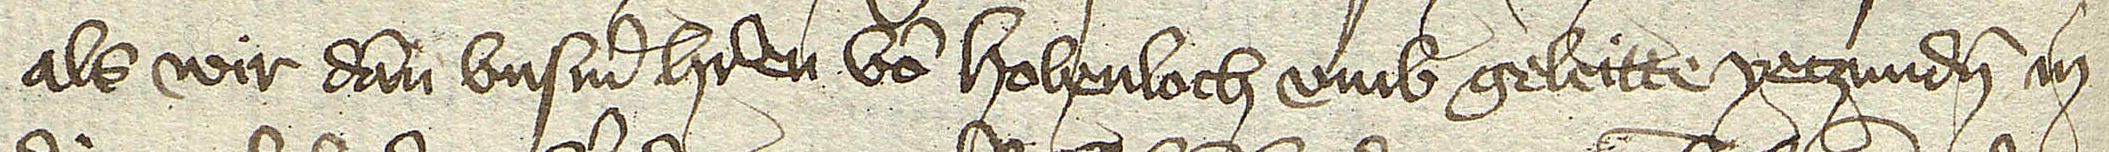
als wir dan* vnſm* hr*en vo* Hohenloch vmb geleitte yecʒundn* in
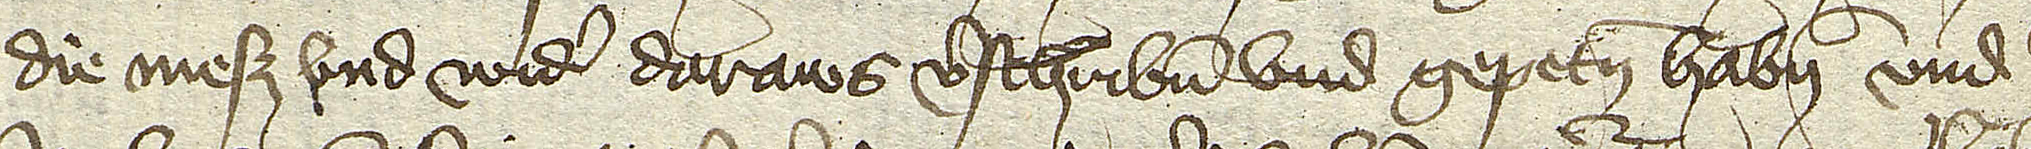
die meſʒ vnd wid* daraws v*ſchribn* vnd gepetn* habn* vnd
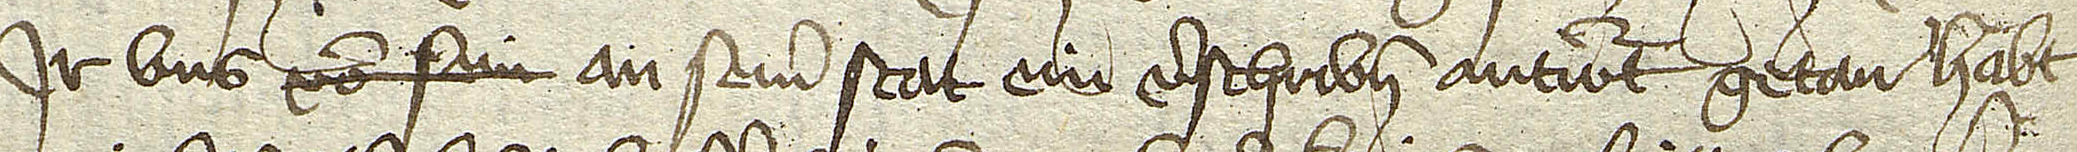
Ir vns vo* ſein an ſein* ſtat ein v*ſchribn* antwt* getan habt
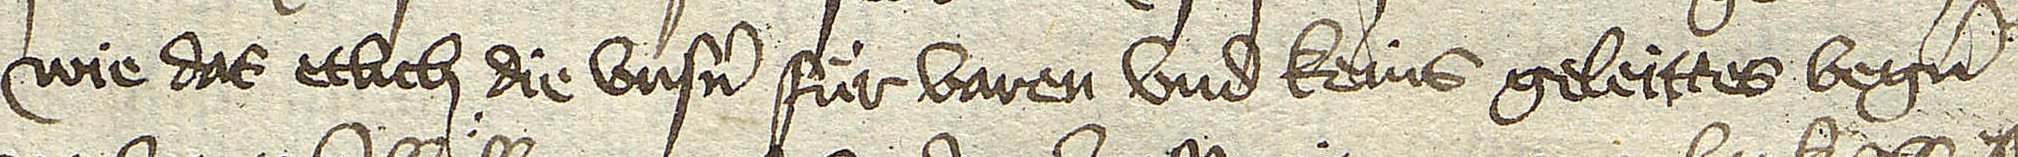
wie das etlich die vnſn* für varen vnd keins geleittes begn*
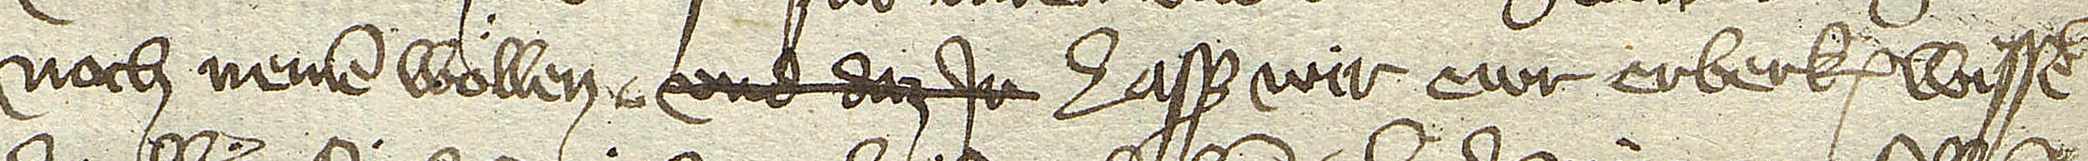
noch neme* wöllen / vnd daʒ Ir Laſſ* wir ewr erberk* wiſſe*
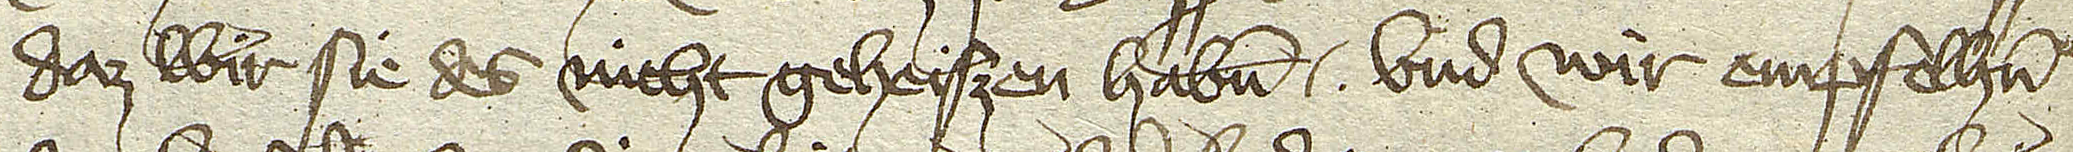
daʒ wir ſie des nicht geheiſʒen habn* / . vnd wir empfelhn*
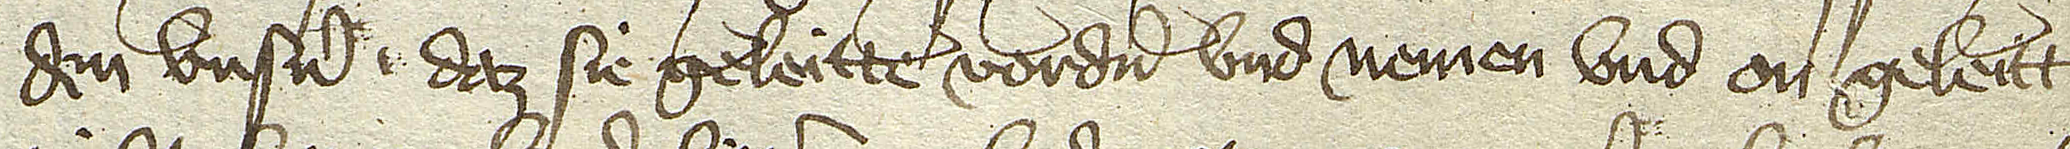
den vnſn* / daʒ ſie geleitte vordn* vnd nemen vnd on geleitt
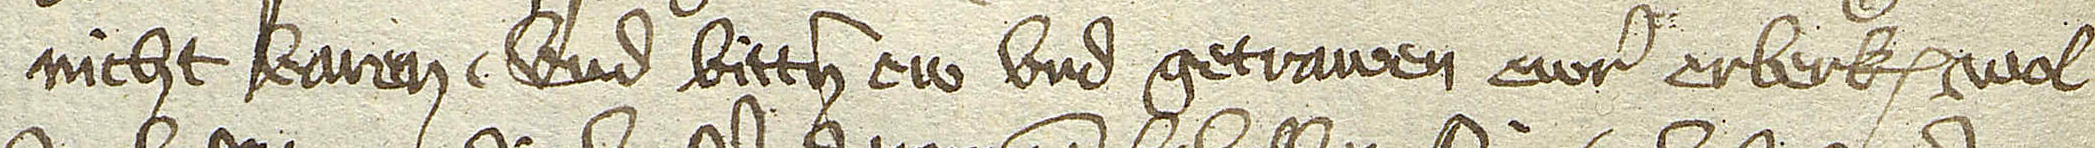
nicht varen / vnd bittn* ew vnd getrawen ewr* erberk* wol
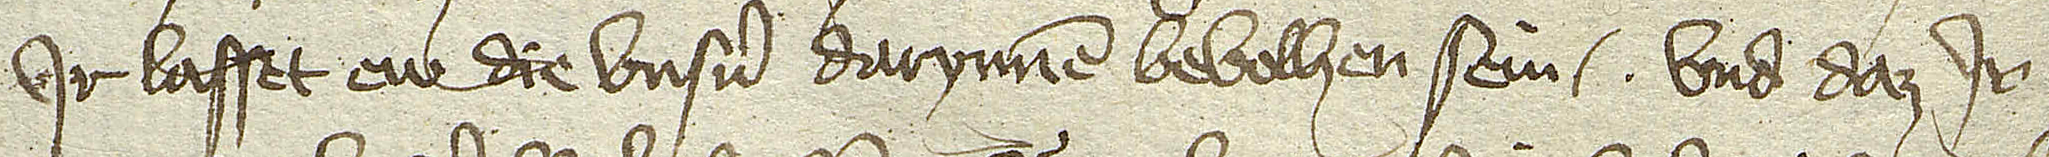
Ir laſſet ew die vnſn* darynne* bevolhen ſein / . vnd daʒ Ir
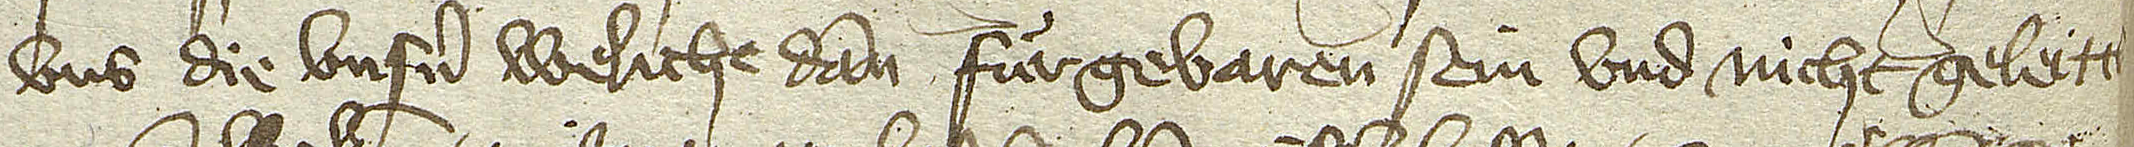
vns die vnſn* weliche dan* fürgevaren ſein vnd nicht geleitte
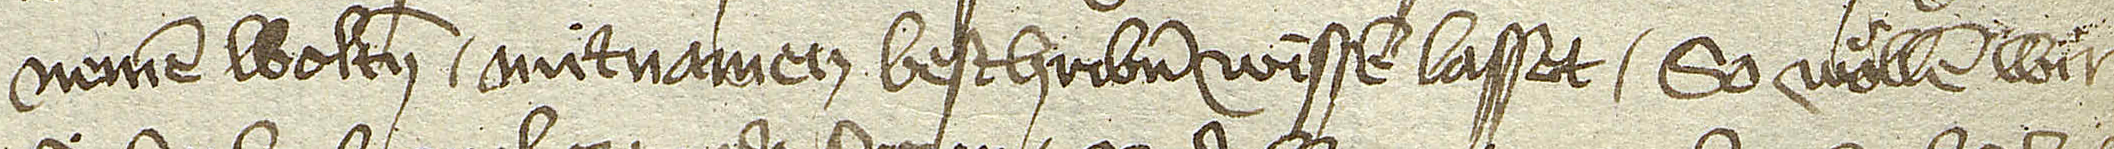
neme* woltn* / mitnamen beſchribn* wiſſe* laſſet / So wölle* wir
